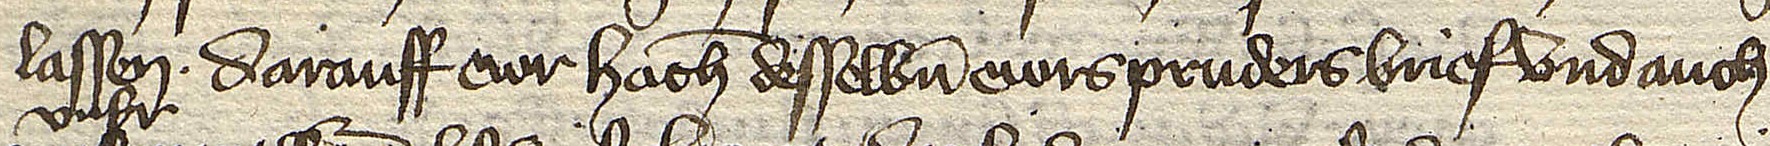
laſſen . Darauff ewr hoch* deſſelbn* ewrs pruders brief vnd auch
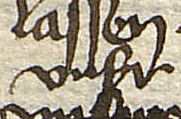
vnſ*r
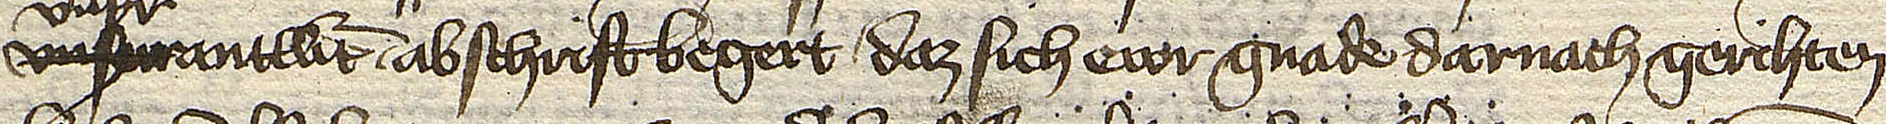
vnſ*n antw*t / abſchrift begert / daʒ ſich ewr gnade darnach gerichten
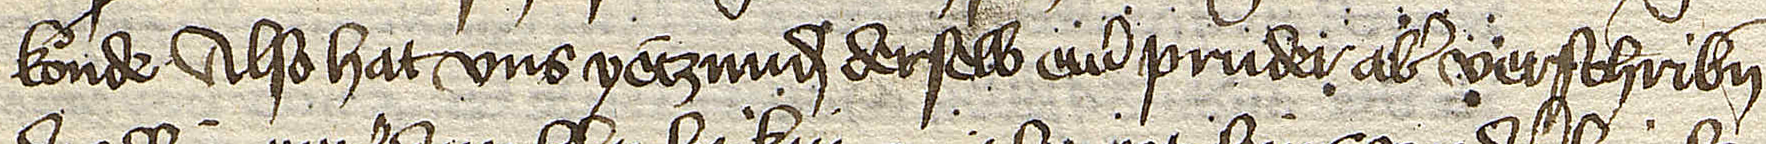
konde Alſo hat vns yecʒund* derſelb ew* pruder ab* verſchribn*
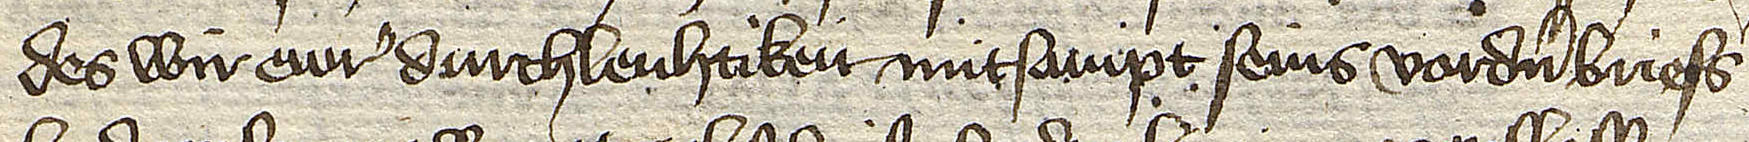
des wir ewr* durchleuhtikeit mitſampt ſeins vordn* briefs
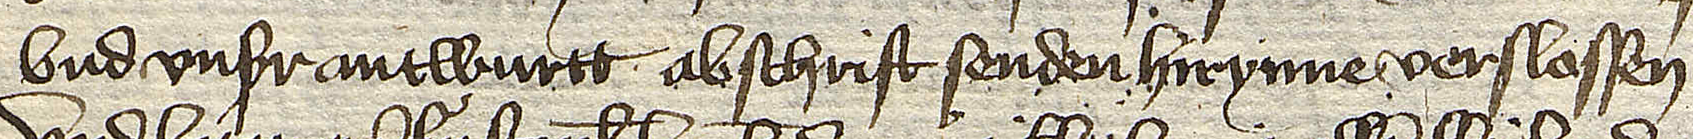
vnd vnſ*r antwurtt abſchrift ſenden hirynne verſloſſen
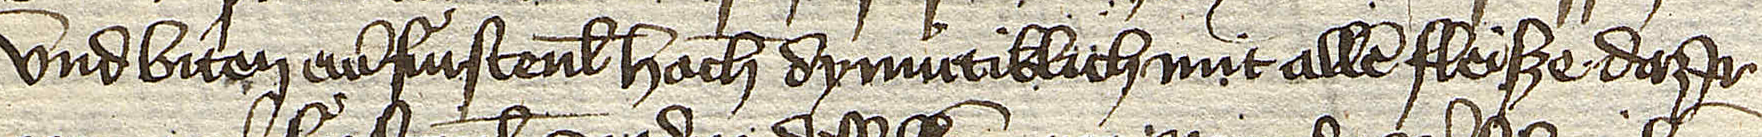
vnd biten ew* fürſtenl* hoch* dymütiklich mit alle* fleiſʒe daʒ Ir
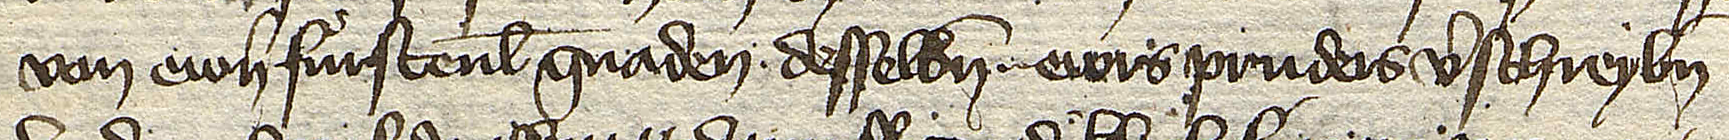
von ewn* fürſtenl* gnaden deſſelbn* ~ ewrs pruders v*ſchreybn*
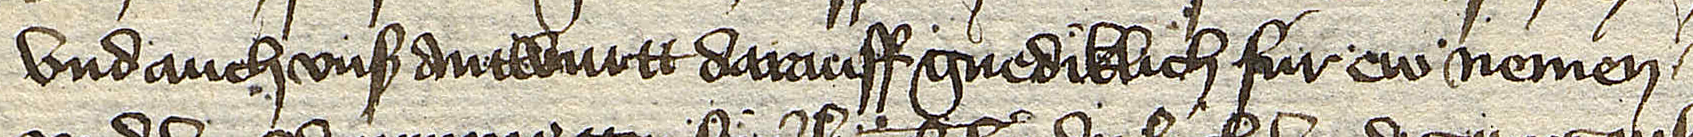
vnd auch vnſ* Antwurtt darauff gnediklich für ew nemen /
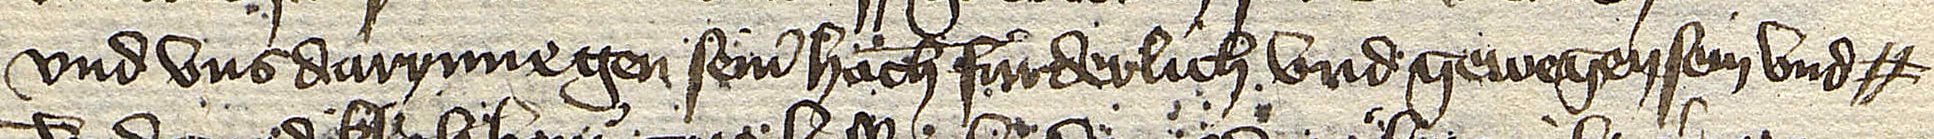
vnd vns darynne gen ſein* hoch* fürderlich vnd gewegen ſein vnd
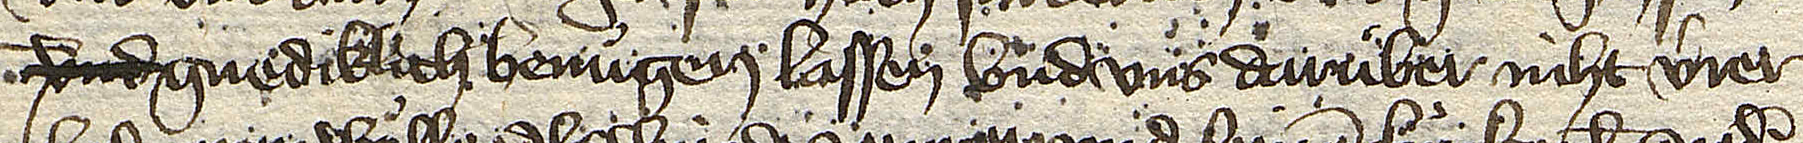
vnd gnediklich benügen laſſen vnd vns darüber niht v*rer
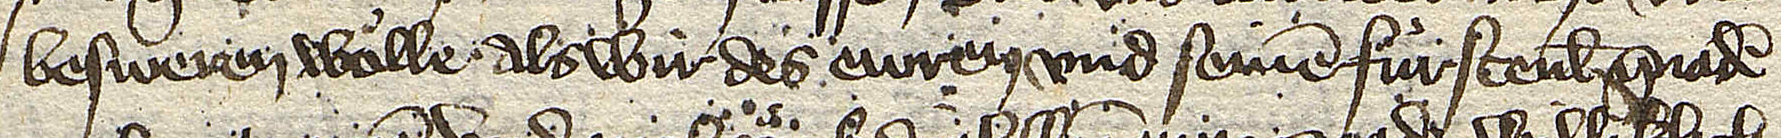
beſweren wölle . Als wir des ewren vnd ſeine* fürſtenl* gnade*
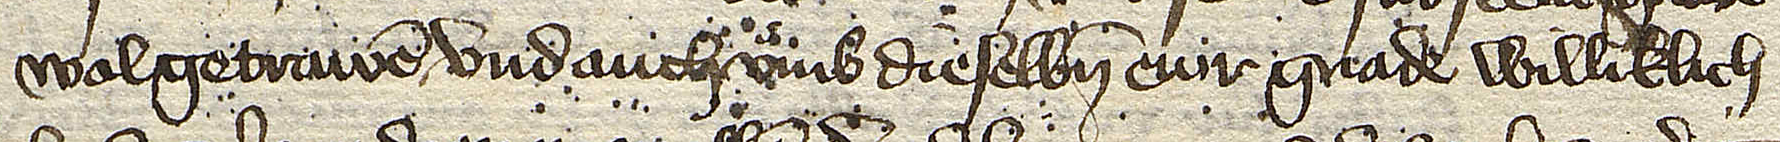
wol getrawe* / vnd auch v̈mb dieſelbn* ewr gnade williklich
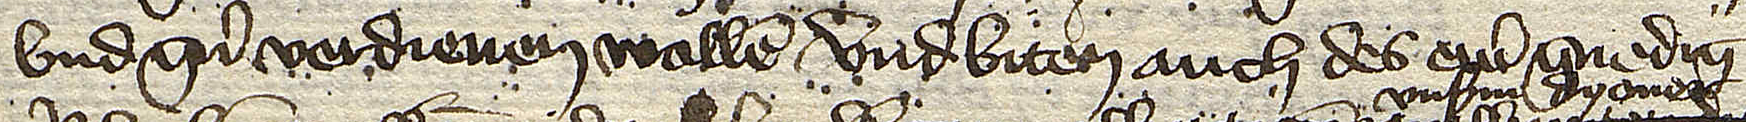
vnd gn* verdienen wölle* / vnd biten auch des ew* gnedig
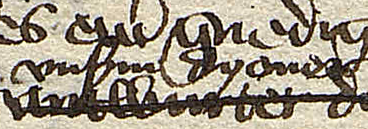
vnſ*m dyener
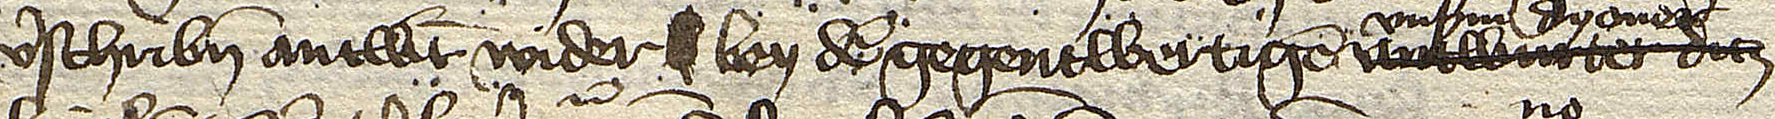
v*ſchribn* antw*t wider b bey d* gegentwertige* antwurter dicʒ
